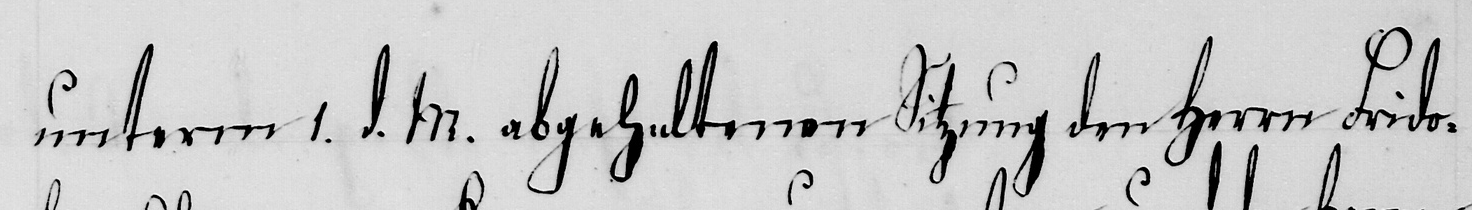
unterm 1. d. M. abgehaltenen Sitzung den Herrn Frid¬
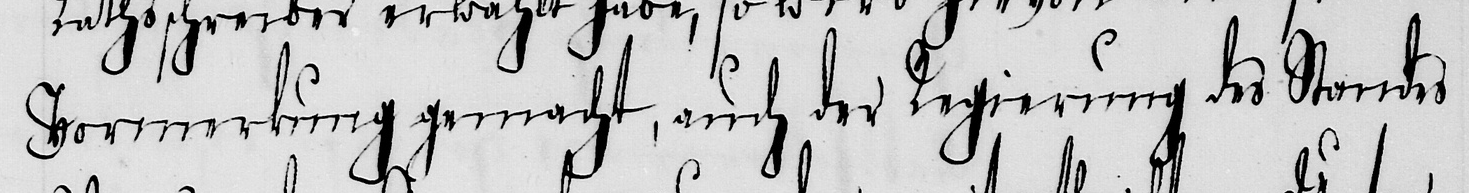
Vormerkung gemacht, auch der Regierung des Standes
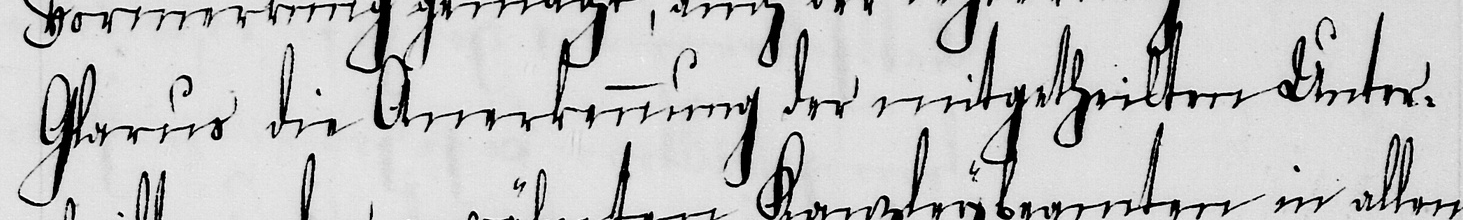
Glarus die Anerkennung der mitgetheilten Unter¬
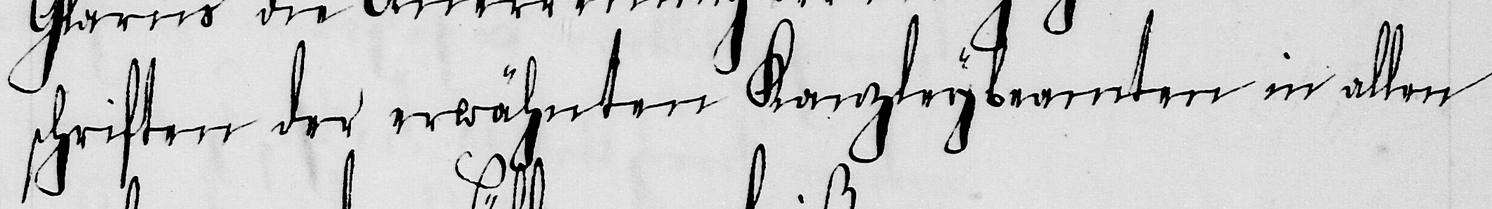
schriften der erwähnten Kanzleybeamten in allen
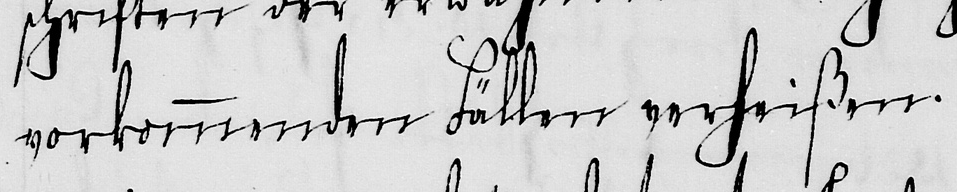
vorkommenden Fällen verheißen.
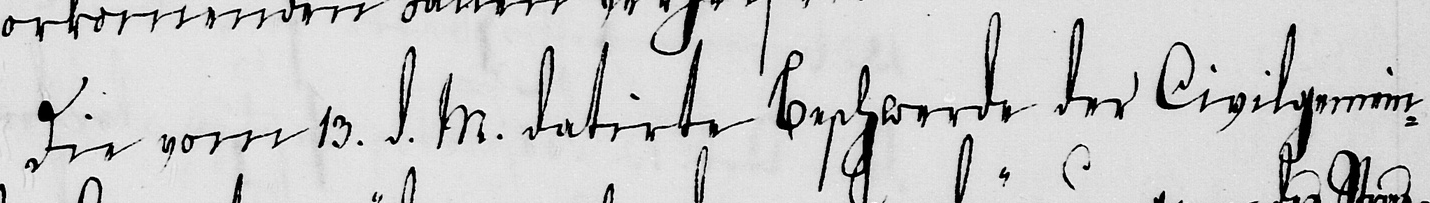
Die vom 13. d. M. datirte Beschwerde der Civilgemein¬
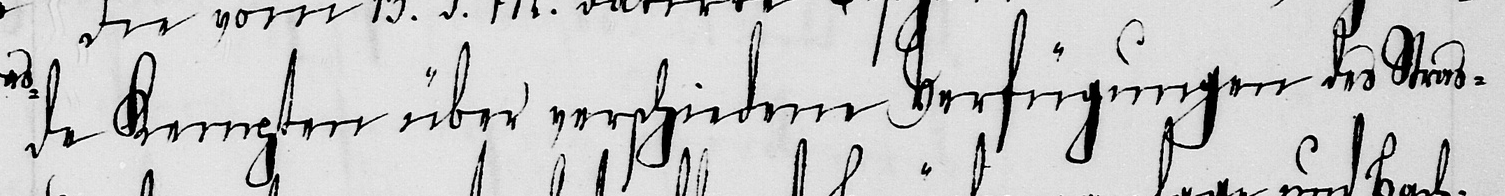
de Kempten über verschiedene Verfügungen des Stra¬
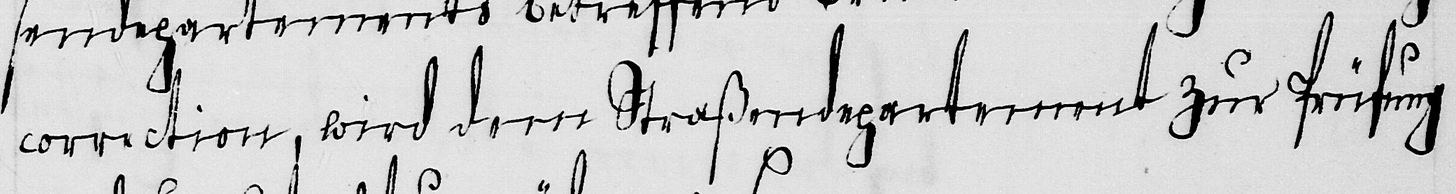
correction wird dem Straßendepartement zur Prüfung
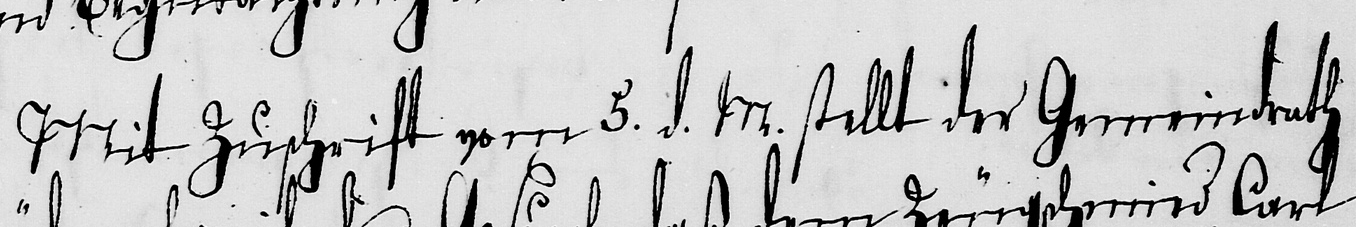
Mit Zuschrift vom 5. d. M. stellt der Gemeindrath
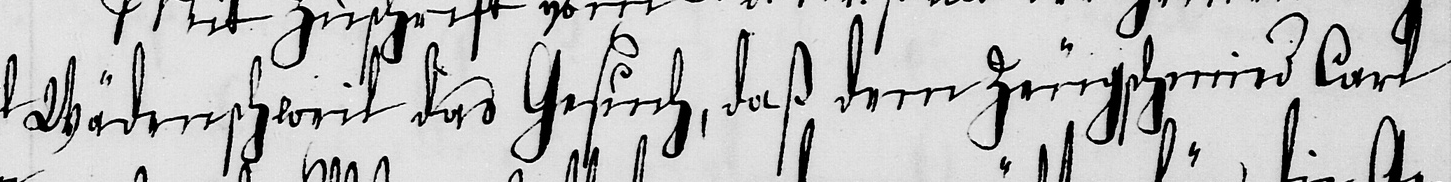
Wädenschweil das Gesuch, daß dem Zeugschmied Carl
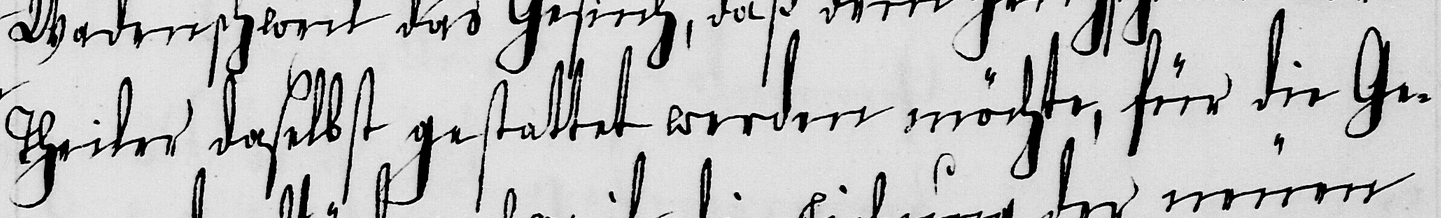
Theiler daselbst gestattet werden möchte, für die Ge¬
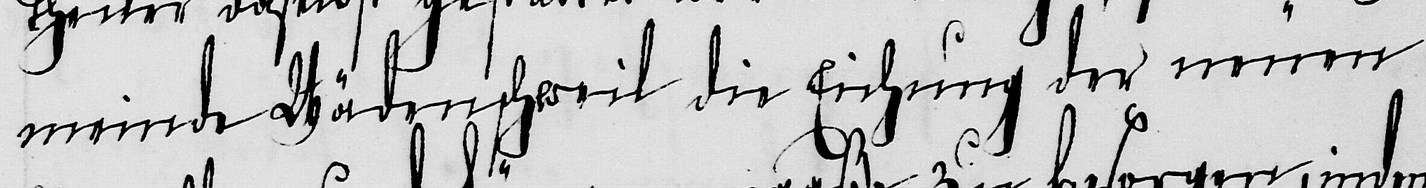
meinde Wädenschweil die Eichung der neuen
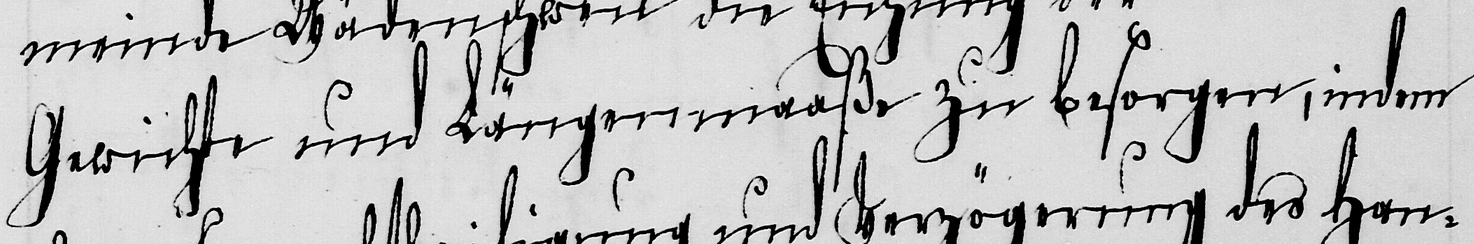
Gewichte und Längenmaaße zu besorgen, indem
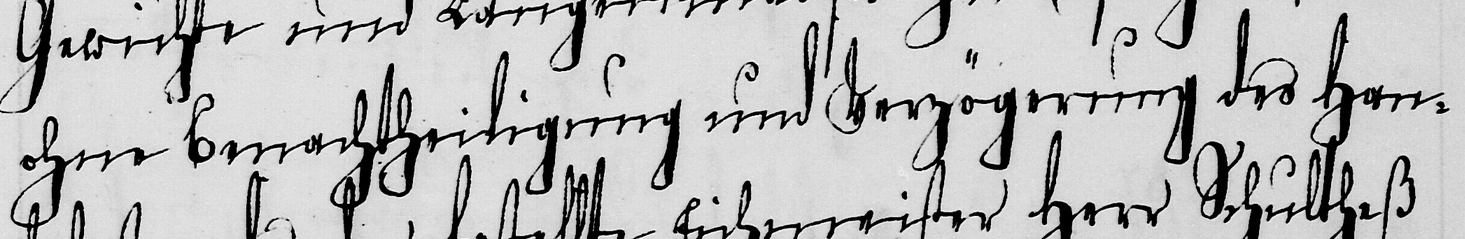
ohne Benachtheiligung und Verzögerung des Han¬
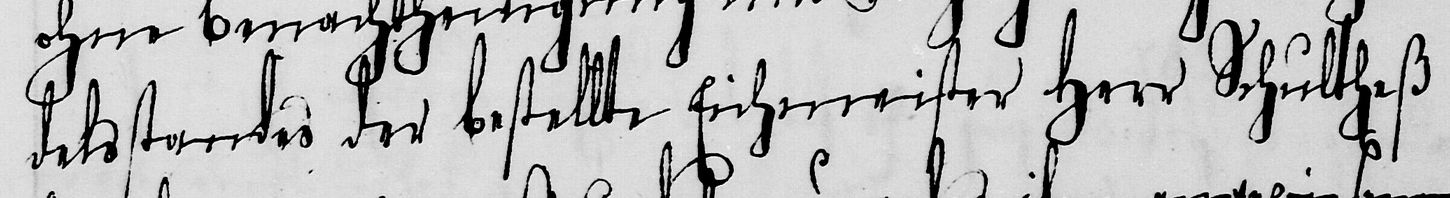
delsstandes der bestellte Eichmeister Herr Schultheß
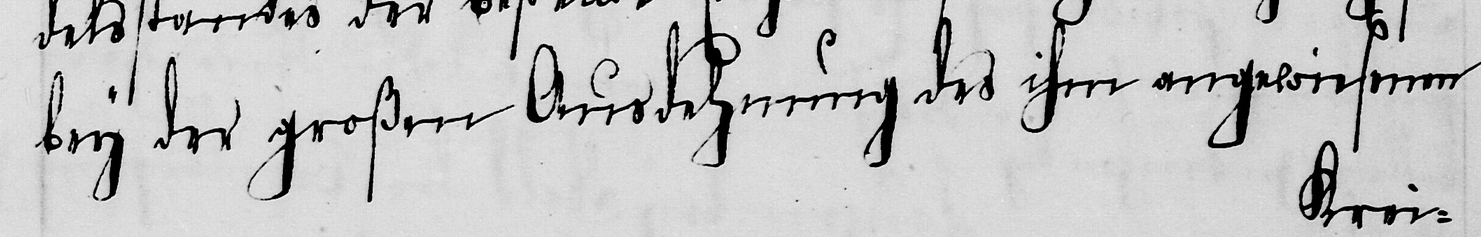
bey der großen Ausdehnung des ihm angewiesenen
